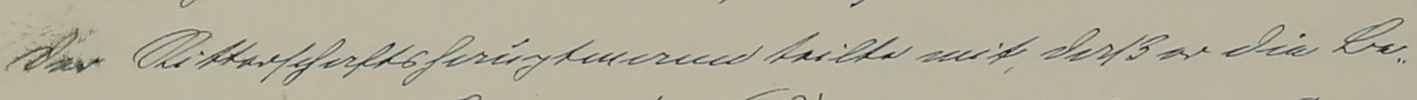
Der Ritterschaftshauptmann teilte mit, daß er die Be-
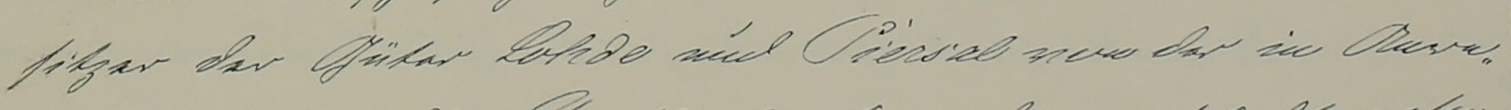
sitzer der Güter Lohde und Piersal von der in Anre-
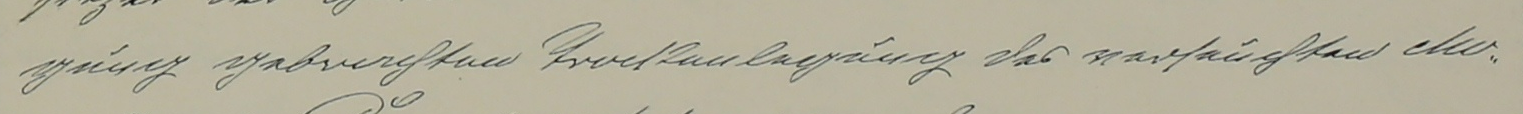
gung gebrachten Trockenlegung des verseuchten Mo-
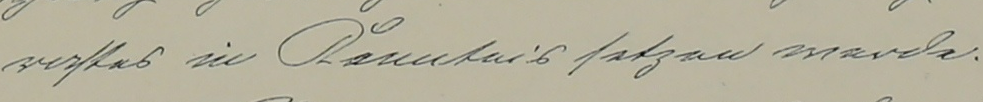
rastes in Kenntnis setzen werde.
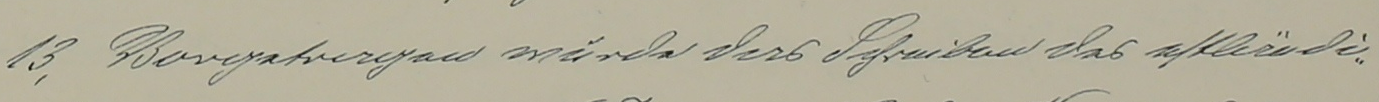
13. Vorgetragen wurde das Schreiben des estländi-
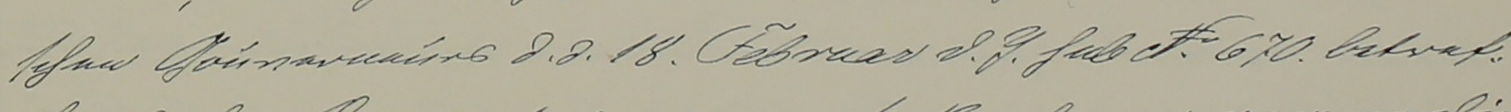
schen Gouverneurs d.d. 18. Februar d.J. sub No. 670 betref-
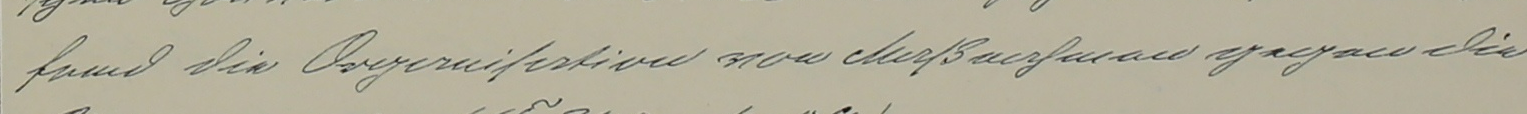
fend die Organisation von Maßnahmen gegen die
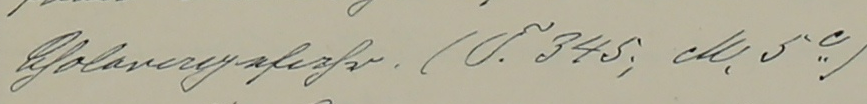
Choleragefahr. (T.345; M.5c)
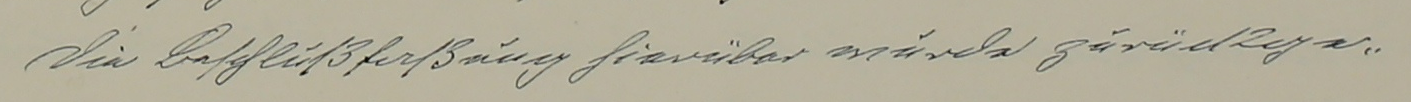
Die Beschlußfaßung hierüber wurde zurückge-
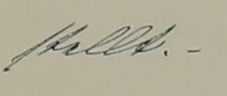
stellt. -
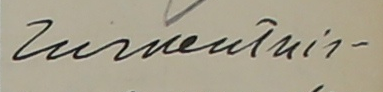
Zurkentnis-
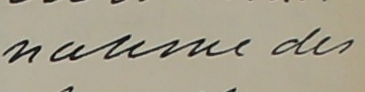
nahme der
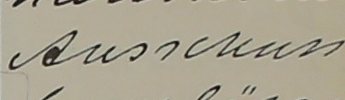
Ausschuss
